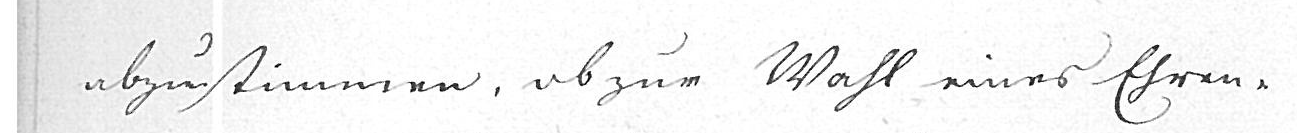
abzustimmen, ob zur Wahl eines Ehren-
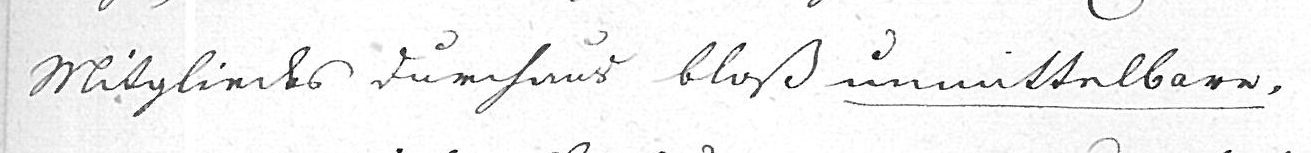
Mitgliedes durchaus bloß unmittelbare,
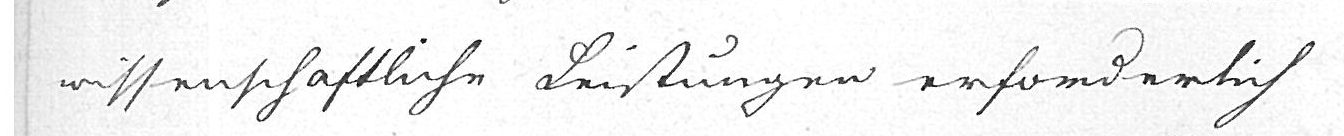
wissenschaftliche Leistungen erforderlich
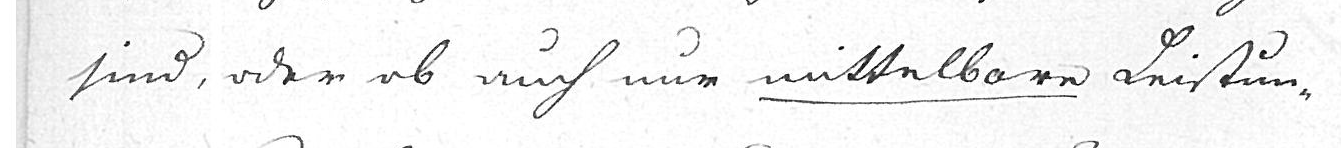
sind, oder ob auch nur mittelbare Leistun-
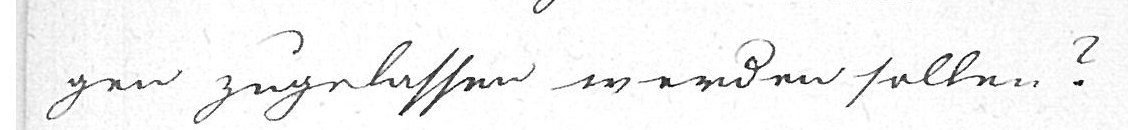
gen zugelassen werden sollen?
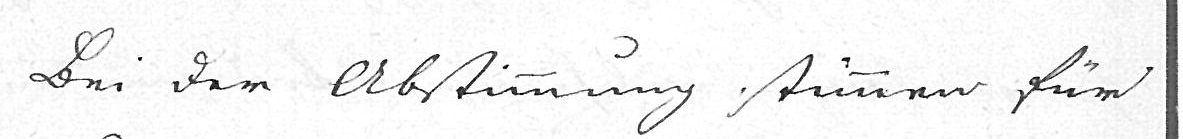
Bei der Abstimmung stimmen für
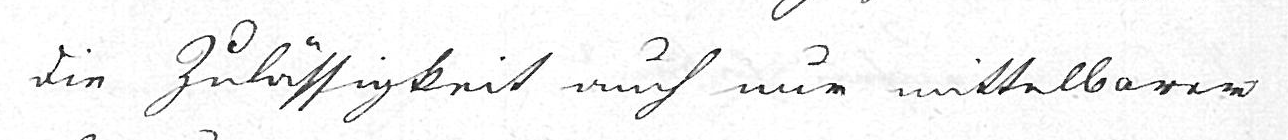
die Zulässigkeit auch nur mittelbarer
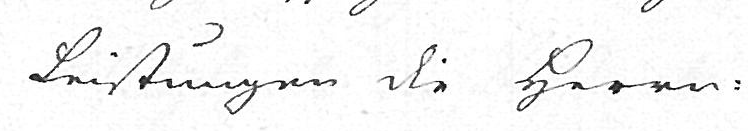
Leistungen die Herrn:
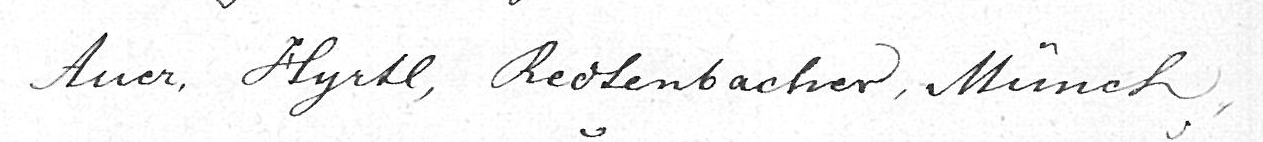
Auer, Hyrtl, Redtenbacher, Münch,
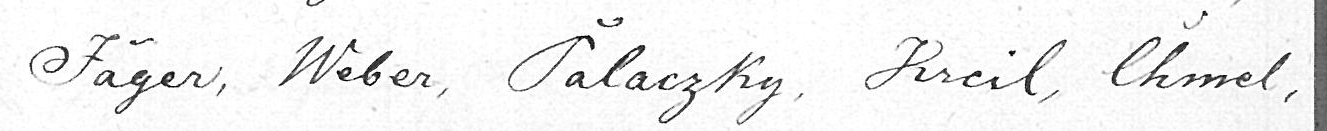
Jäger, Weber, Palaczky, Kreil, Chmel,
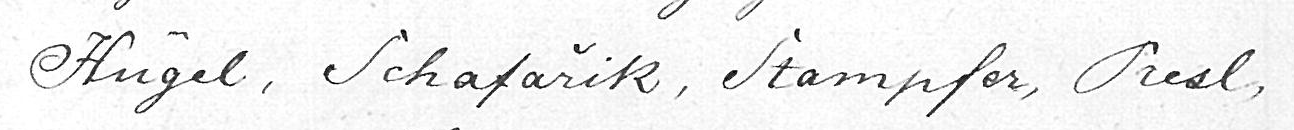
Hügel, Schafarzik, Stempfer, Presl,
